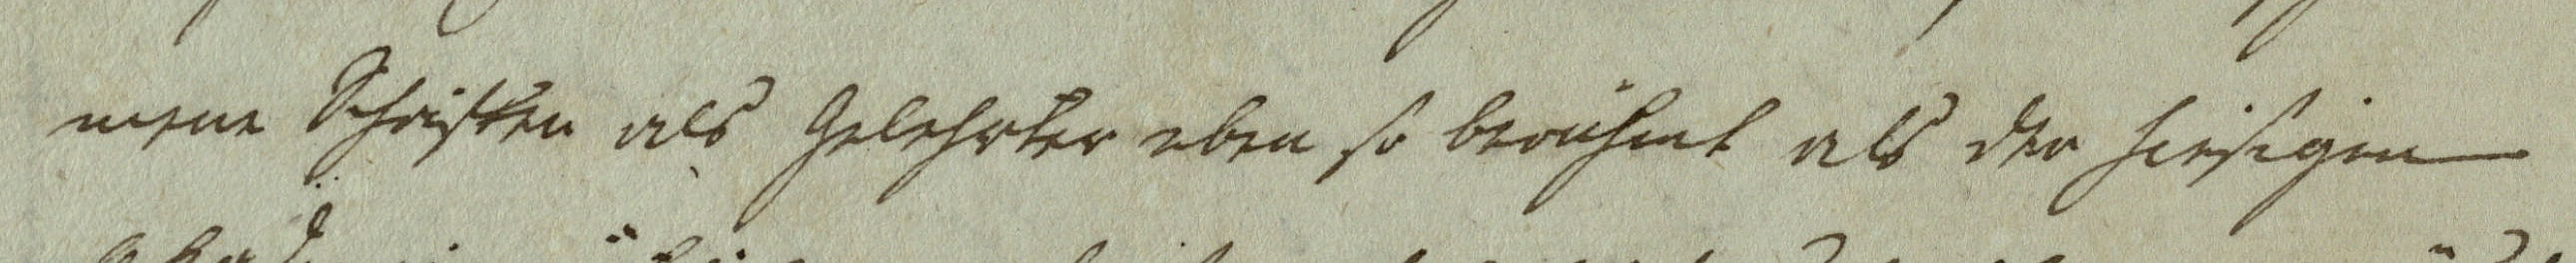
neue Schriften als gelehrter eben so Bericht als der hiesigen
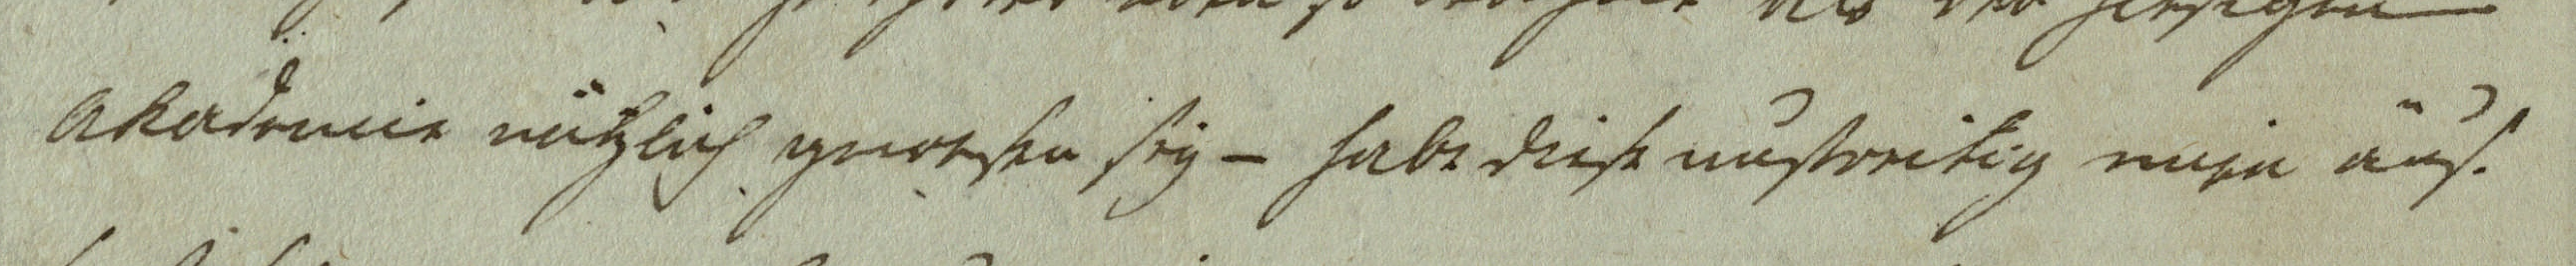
Akademie nntzlich gewesen seÿn habe diese unstreitig einen aus
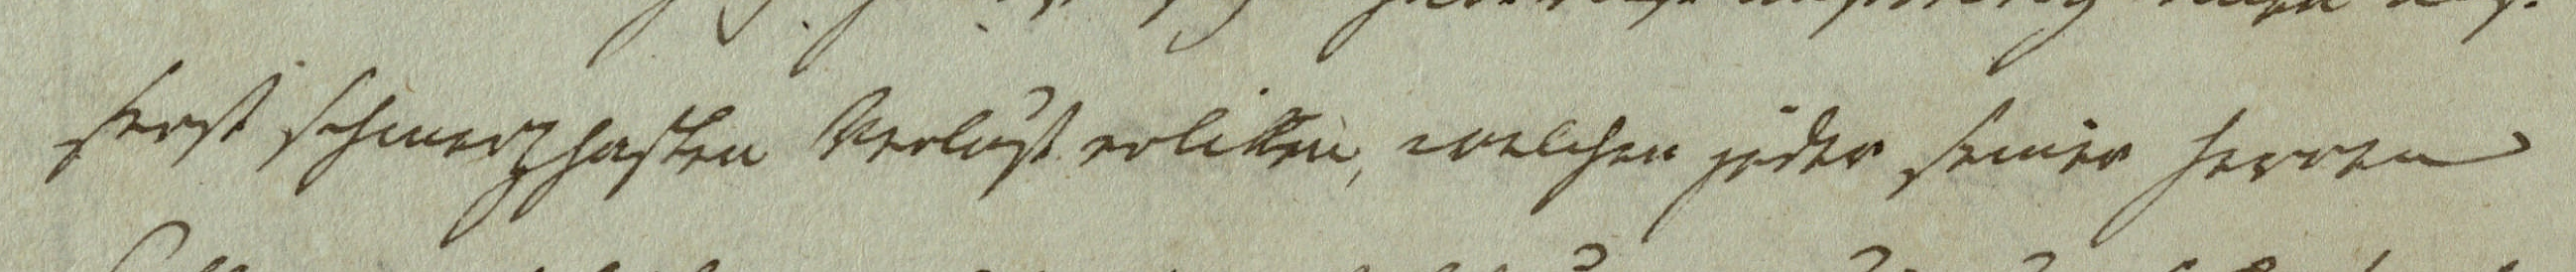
erst sehnerdzhaften Verlust eoliten, welchen jeder seiner Herren
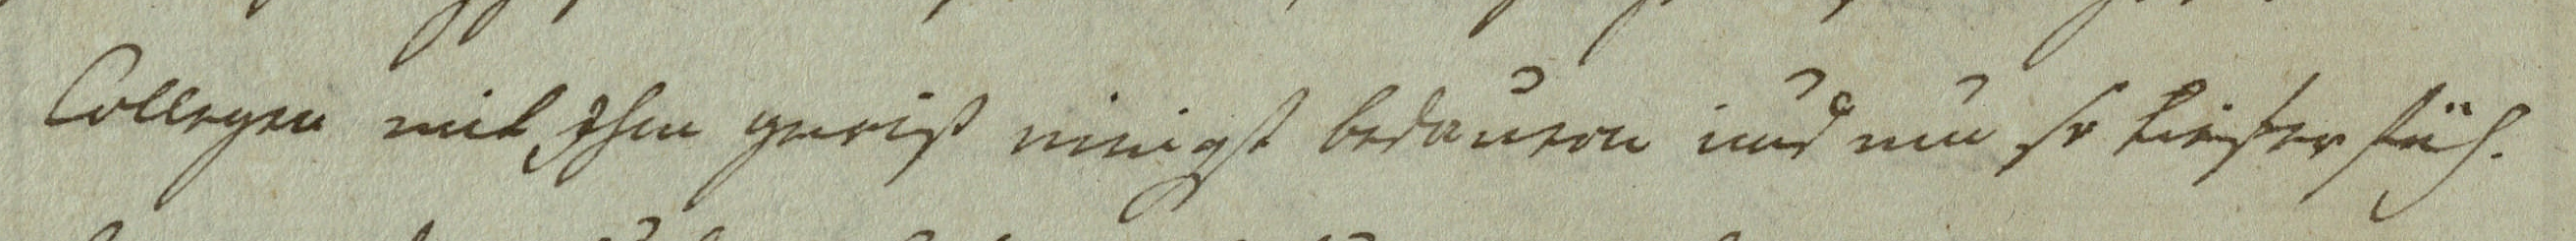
Collegen mit ihm gewiß mit bedanern und um so tiefer füh¬
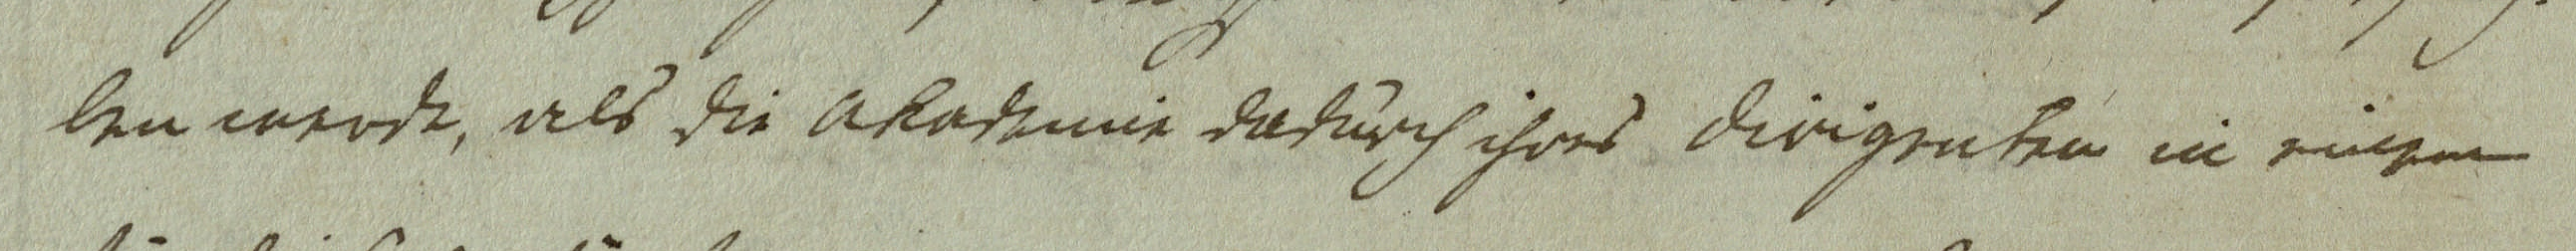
ben werde, als die Akademie dadurch ihres Dirigenten in einen
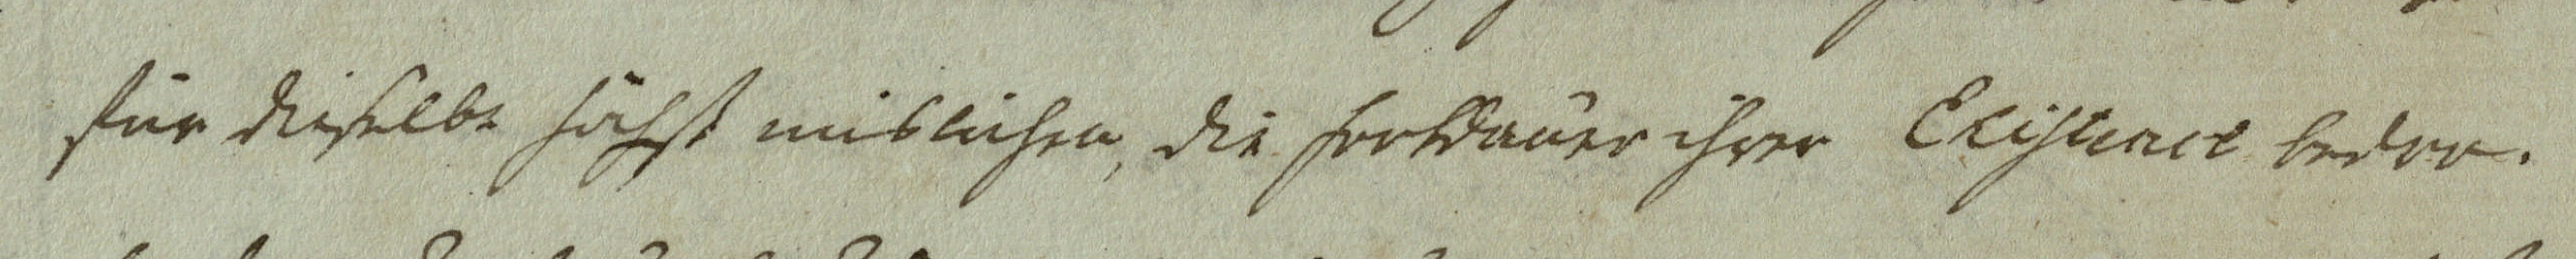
für dieselbe höchst miblichen, die Foodauer ihrer Ceisence bedvo¬
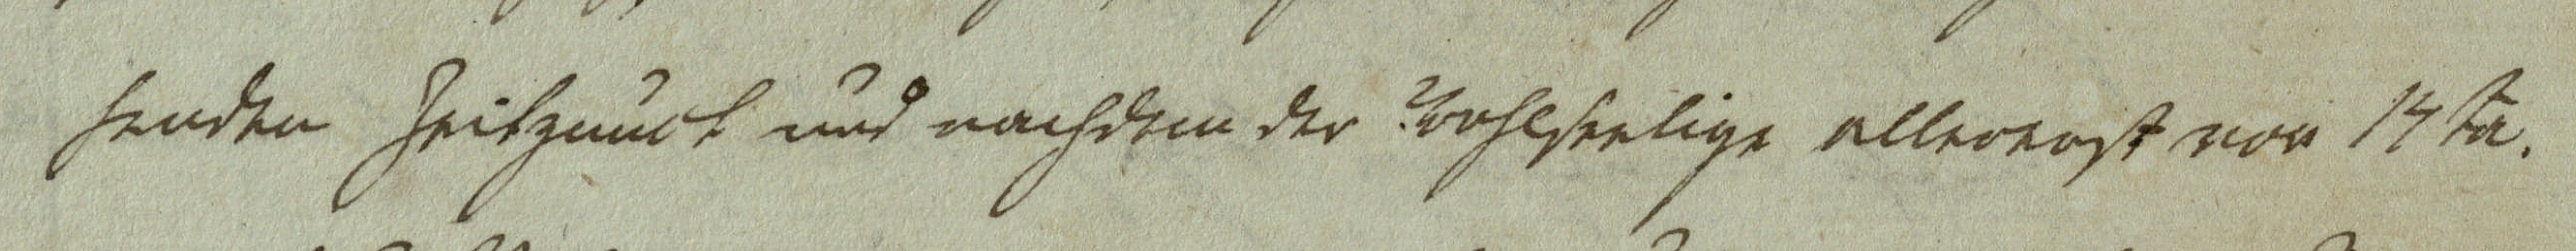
fenden Zeitpunct und nachdem der Wohlselige allererst von.
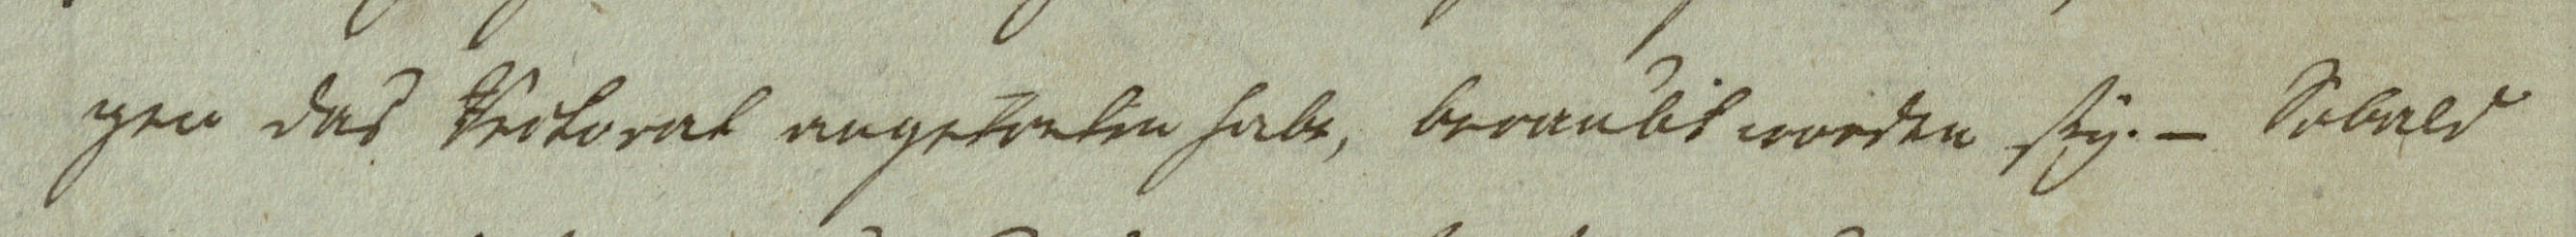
gen das Rectorat angetreten habe, beraubt worden seÿ. Sobals
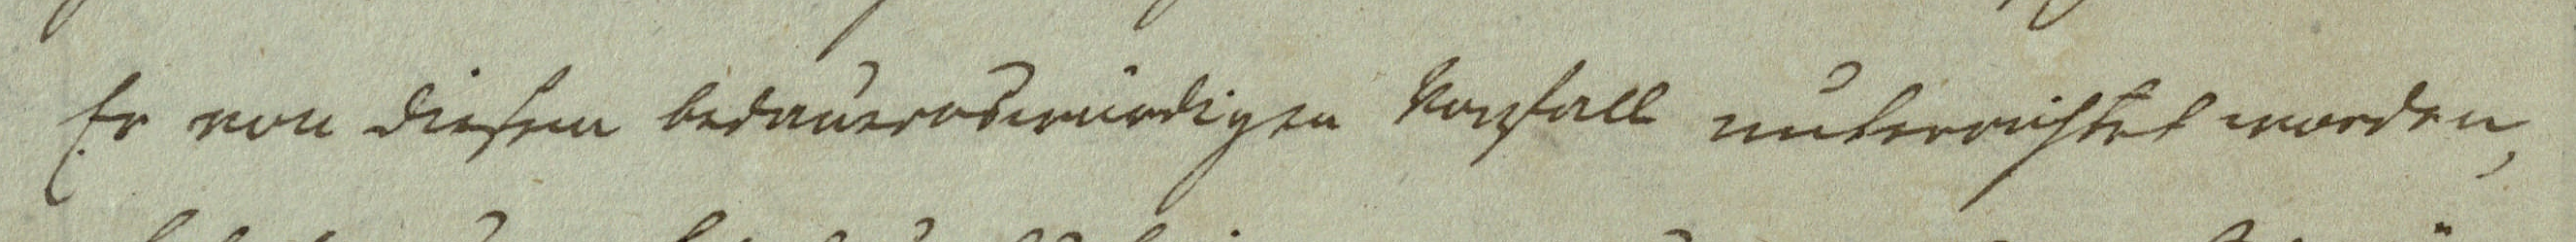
Er von diesem bedaueraswürdigen Vorfall unterrichtet worden
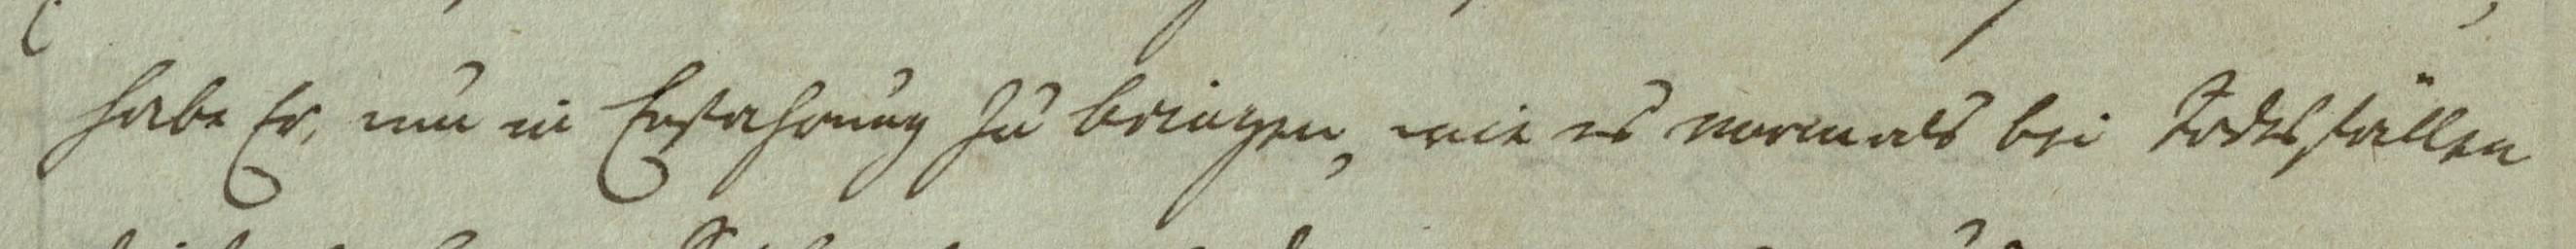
habe Er, um in Erfahrung zu bringen, wie es vormals bei Todes fallen
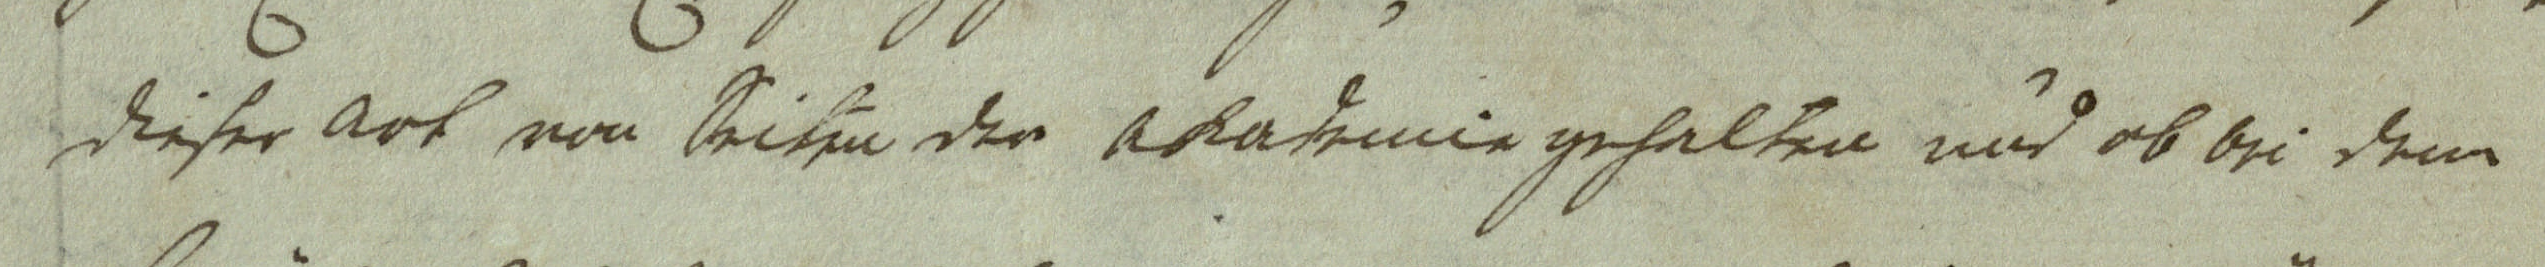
dieser Art von Seiten der Akademie gehalten und ob bei den
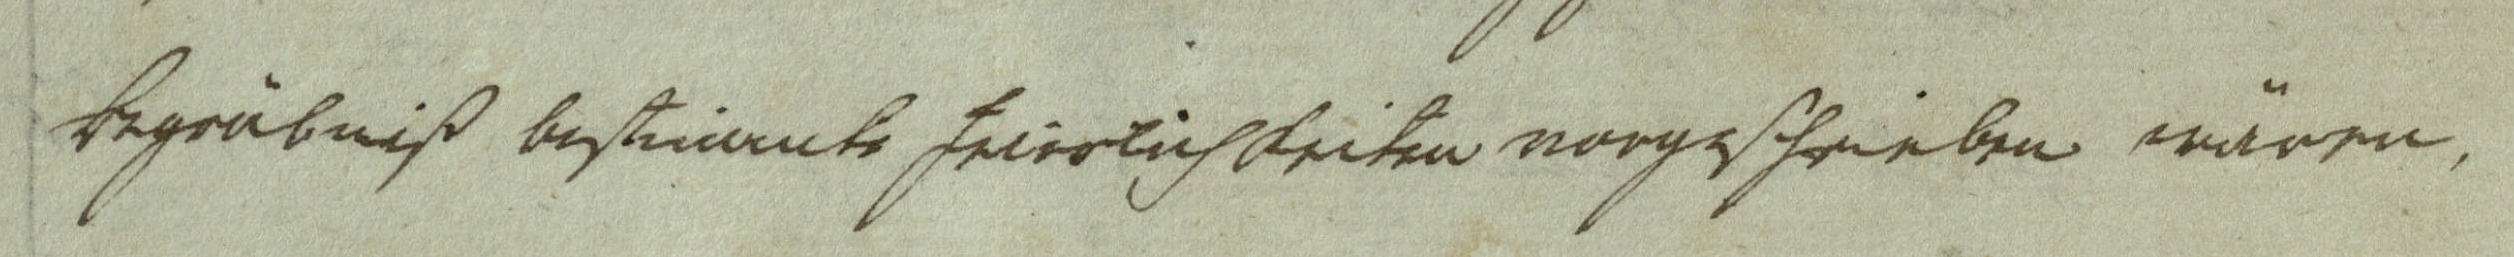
Begräbnis bestimmt heierlicheiten vorgeschrieben wären,
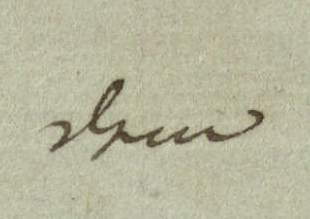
dem
